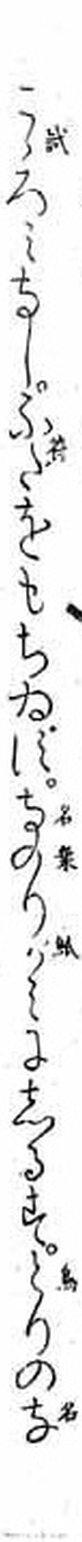こゝろみなし。ふだをもちゐず。なのりがみにしるす。とりのな
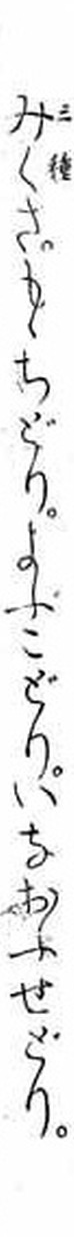みくさ。もゝちどり。よぶこどり。いなおふせどり。
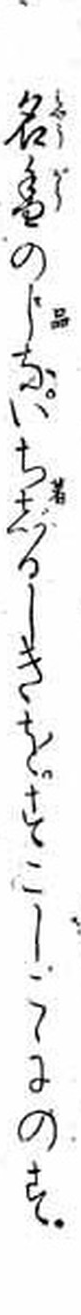名香のしな。いちじるしきを。すこしこゝにのす。

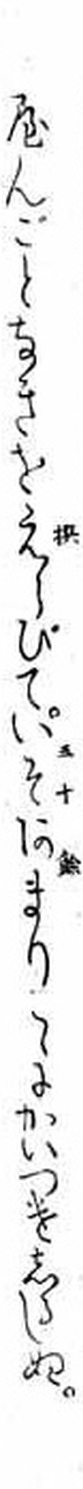やんごとなきをえらびて。いそあまりこゝにかいつけしるしぬ。
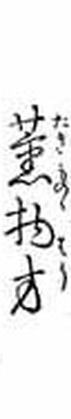薫物方
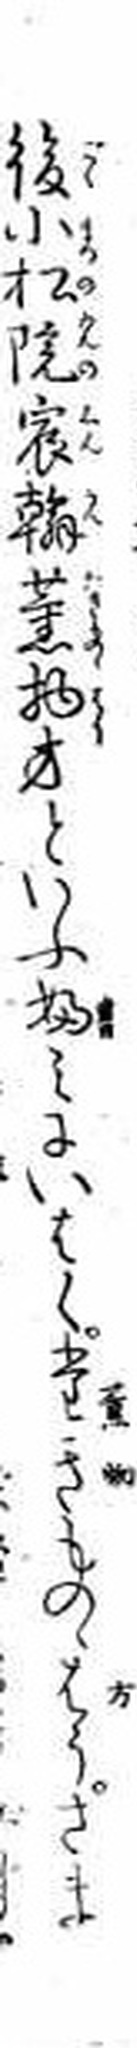後小松院宸翰薫物方といふふみにいはく。たきものゝはう。さま
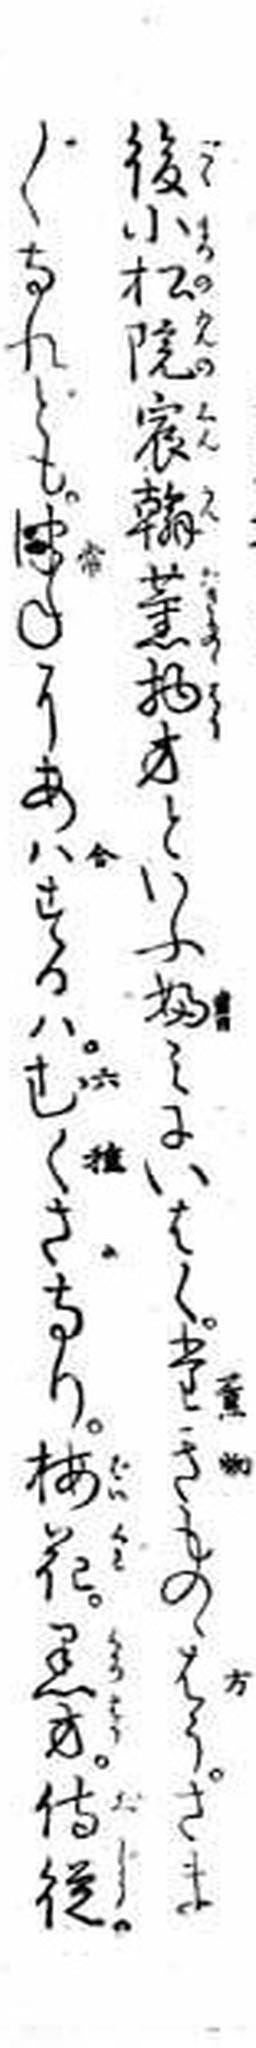〴〵なれども。つねにあはするは。むくさなり。梅花。黒方。侍従。
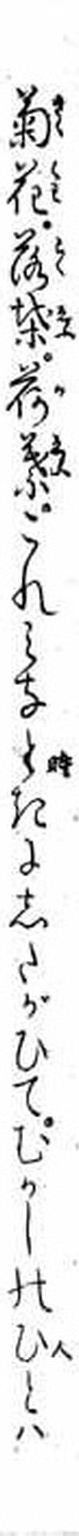菊花。落葉。荷葉。これみなときにしたがひて。むかしのひとは
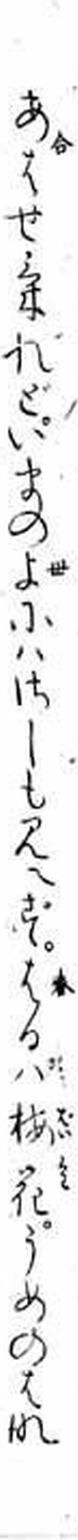あはせけれど。いまのよにはさしも見えず。はるは梅花。うめのはな
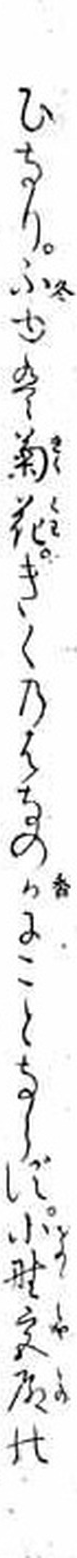ひなり。ふゆは菊花。きくのはなのかにことならず。小野宮殿の
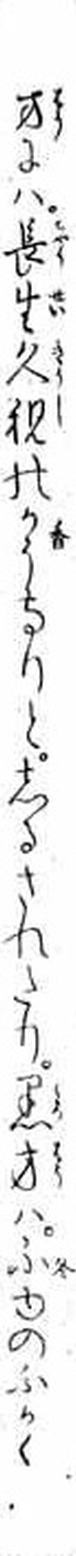方には。長生久視のかうなりと。しるされたり。黒方は。ふゆのふかく
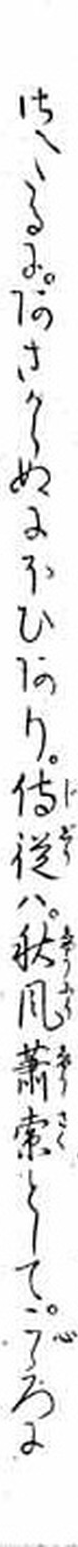さへたるに。あさからぬにほひあり。侍従は。秋風蕭索として。こゝろに
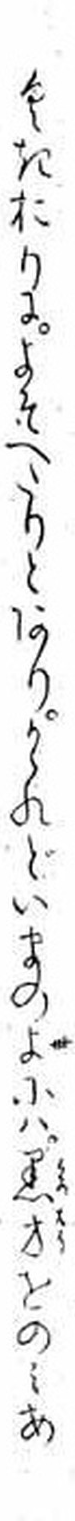くきおりに。よそへたりとあり。かゝれどいまのよには。黒方をのみあ
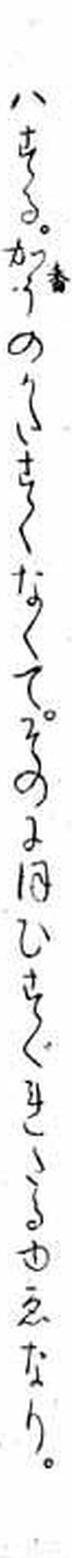はする。かうのかたすくなくて。そのにほひすぐれたるゆゑなり。

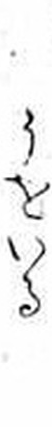うをいる
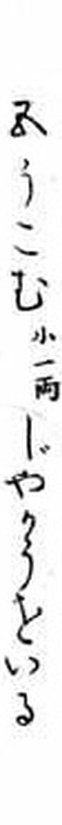五うこむ小一両じやかうをいる
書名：女学範
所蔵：東京学芸大学教育コンテンツアーカイブ
